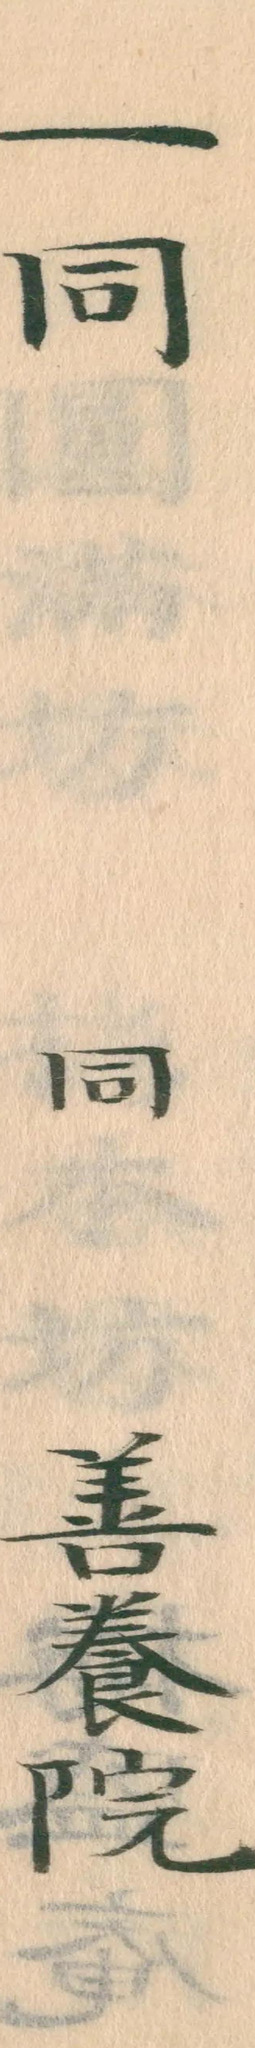一同同善養院
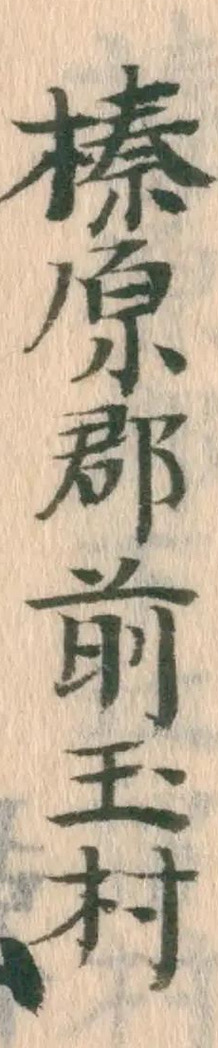榛原郡前玉村
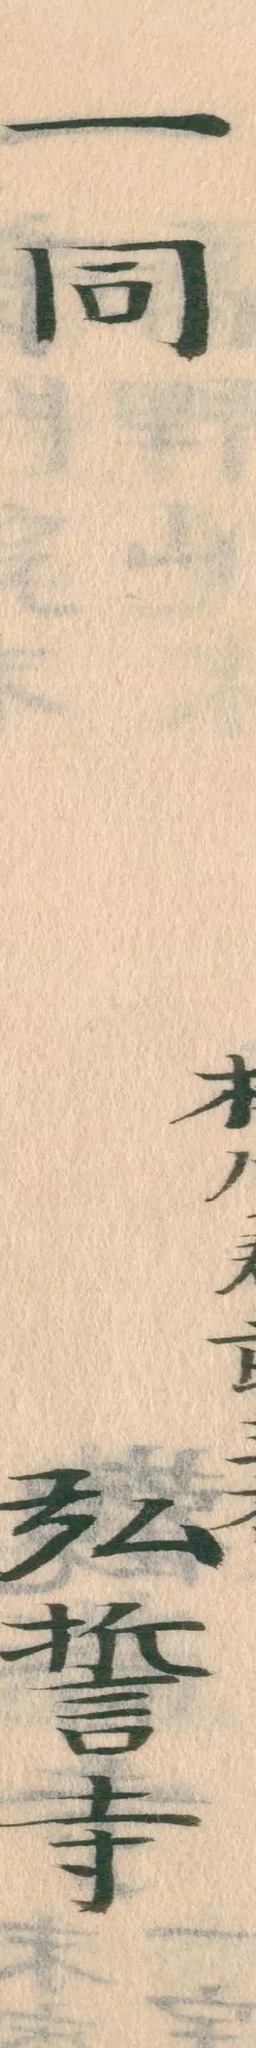一同弘誓寺
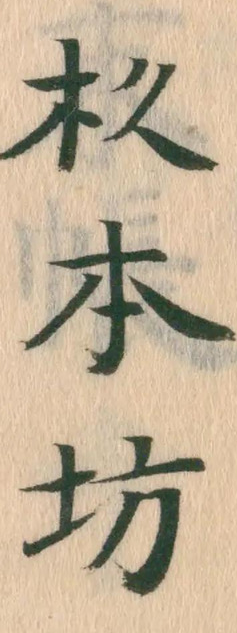杉本坊
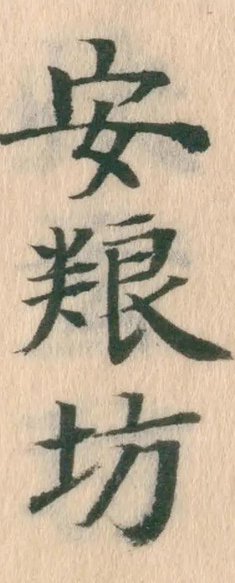安羪坊

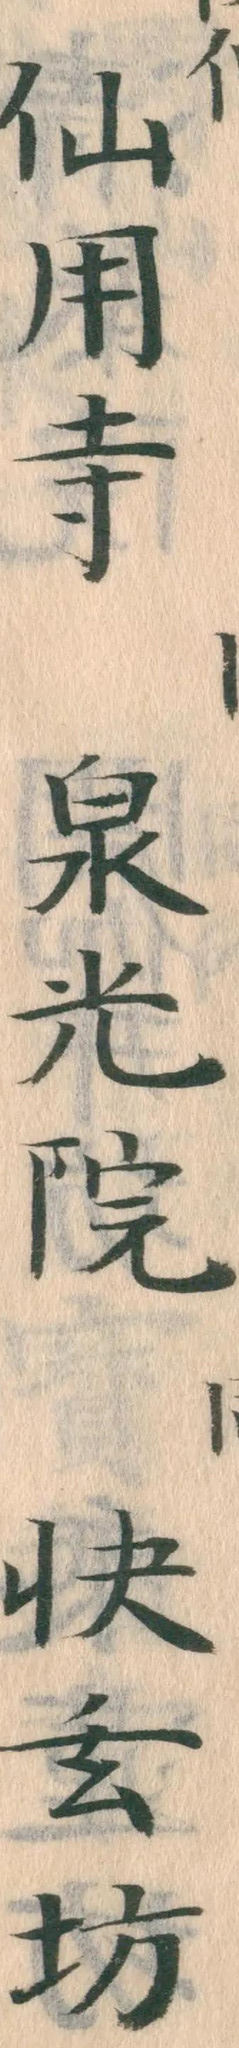仙用寺泉光院快玄坊
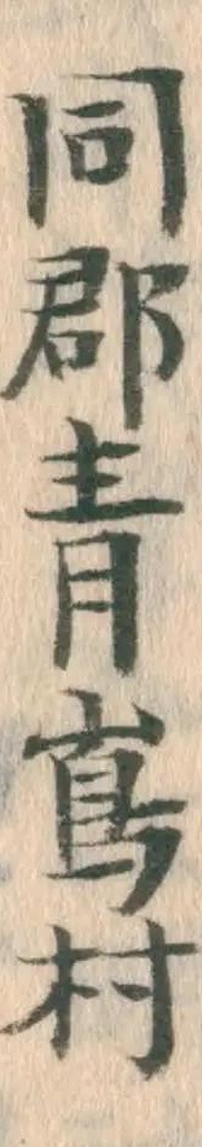同郡青嶋ｍ
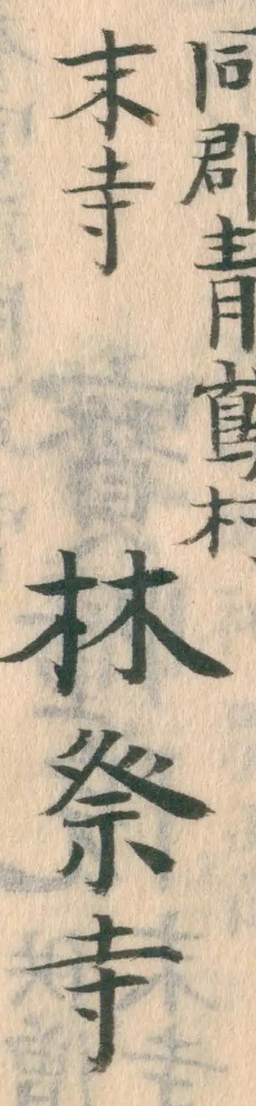未寺林祭寺

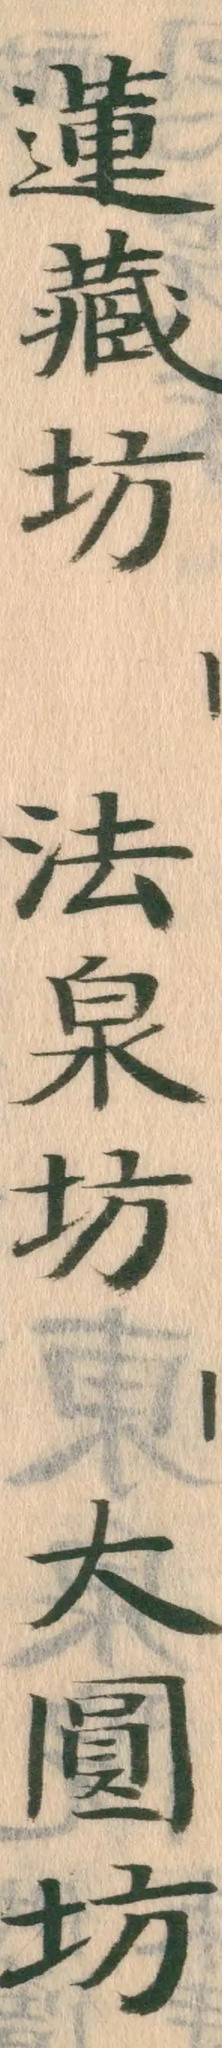蓮蔵坊法泉坊大圓坊
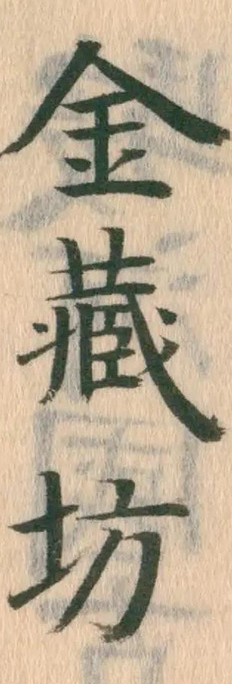金蔵坊
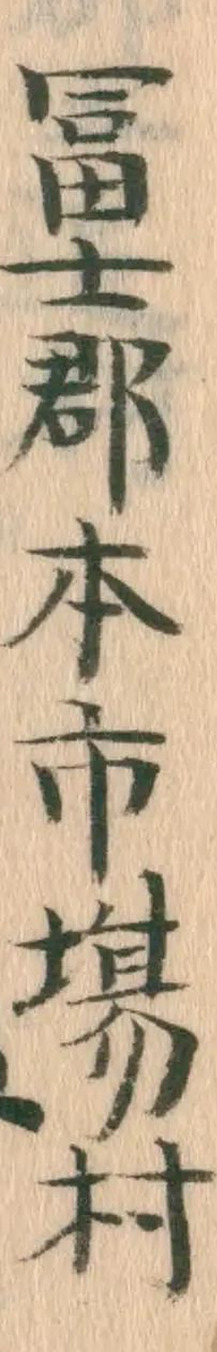富士郡本市場村
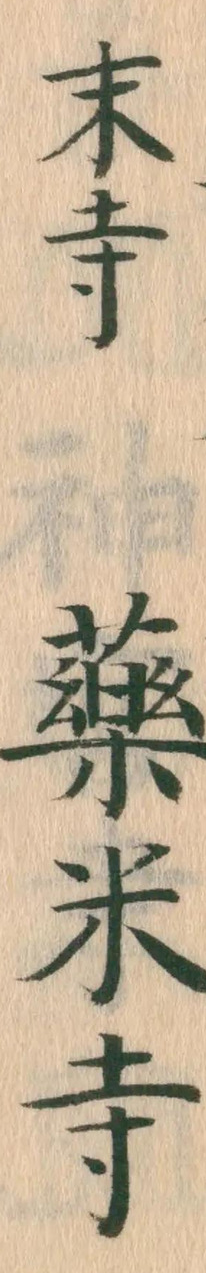未寺薬米寺
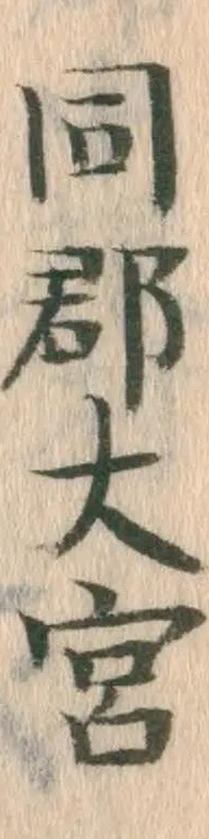同郡大宮
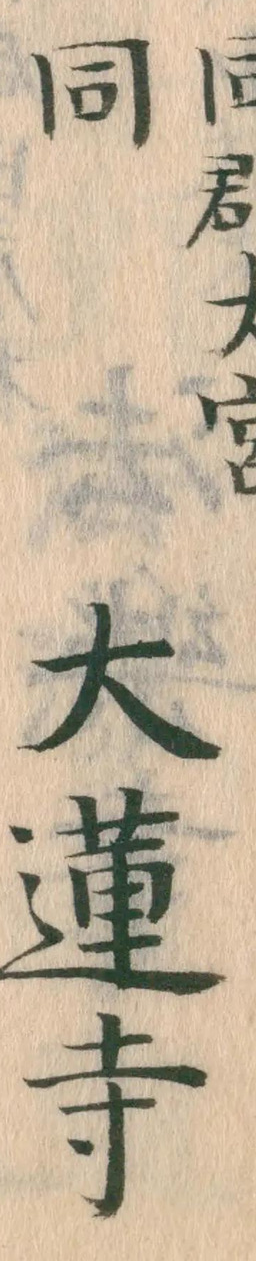同大蓮寺

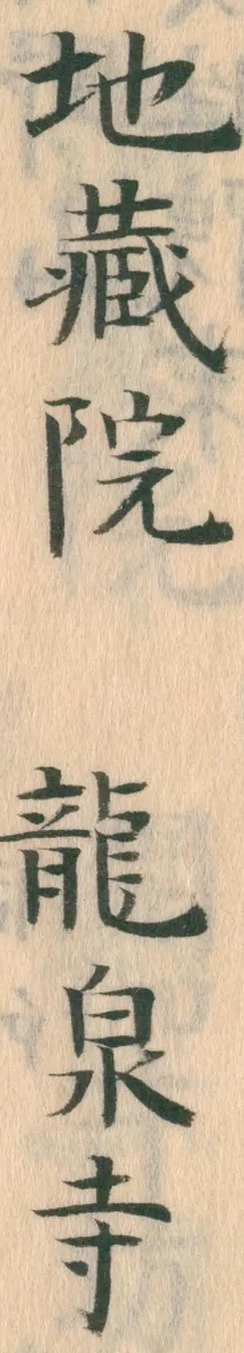地蔵院龍泉寺
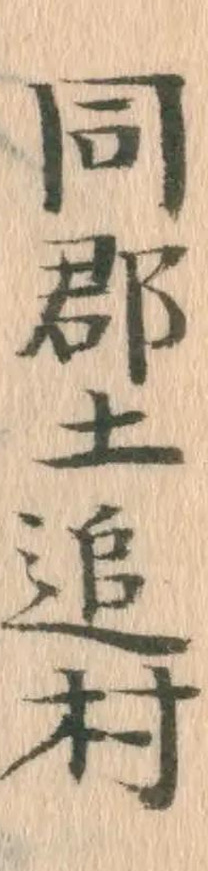同郡中根村
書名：古義真言宗本末帳 21巻. [4] 第三 伊賀国、伊勢国、志摩国、尾張国、三河国、遠江国、駿河国、伊豆国、甲斐国
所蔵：国立国会図書館 National Diet Library, JAPAN
